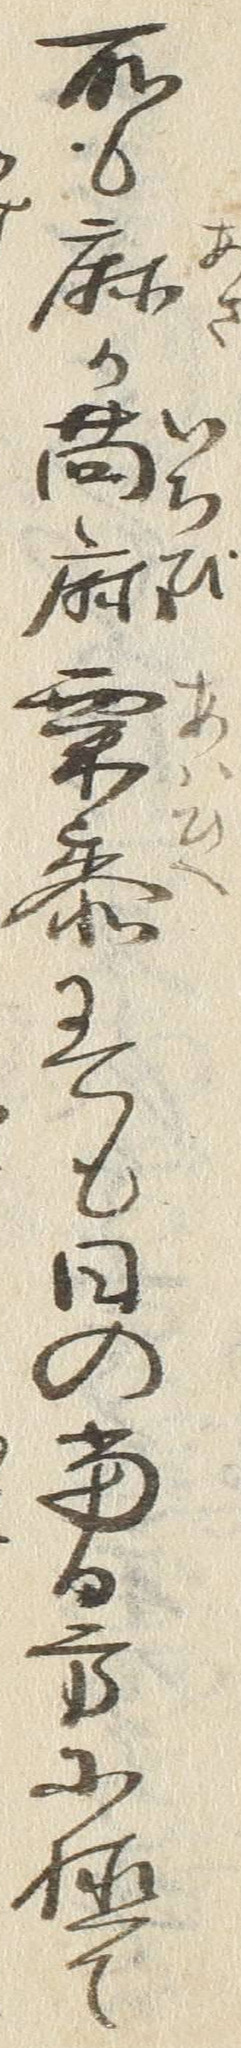所も麻か莔麻粟黍尓ても日の当る方尓植て
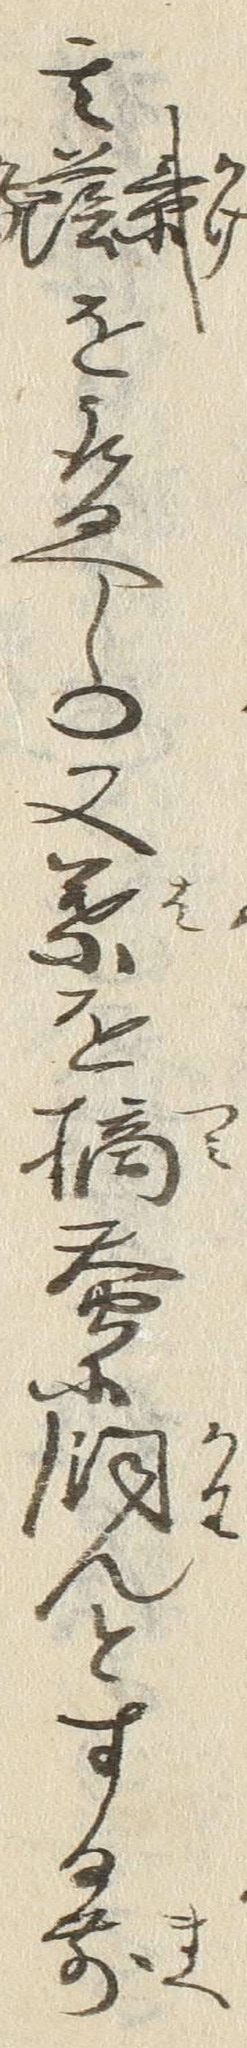其蔭を取るへし〇又葉を摘蚕尓飼んとする前
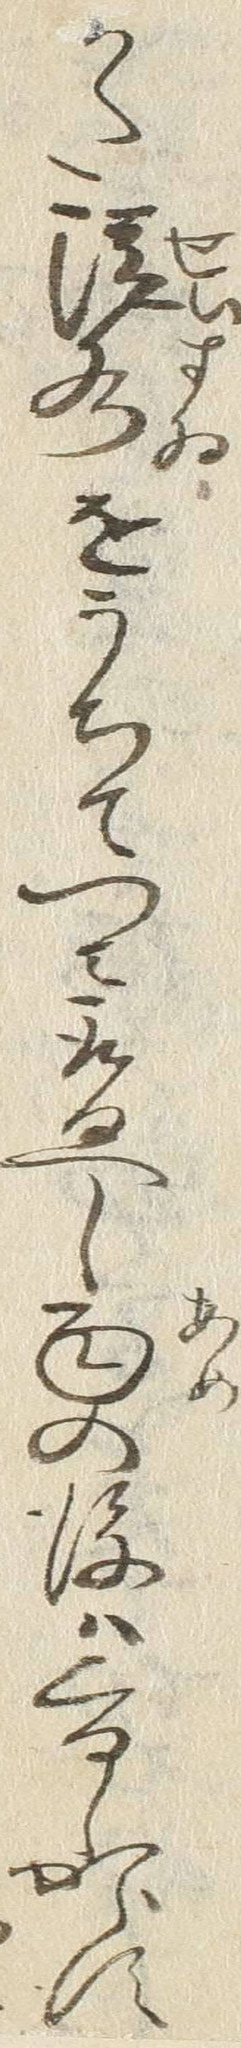かた清水をうちてつみ取るへし雨の後はくるしから須
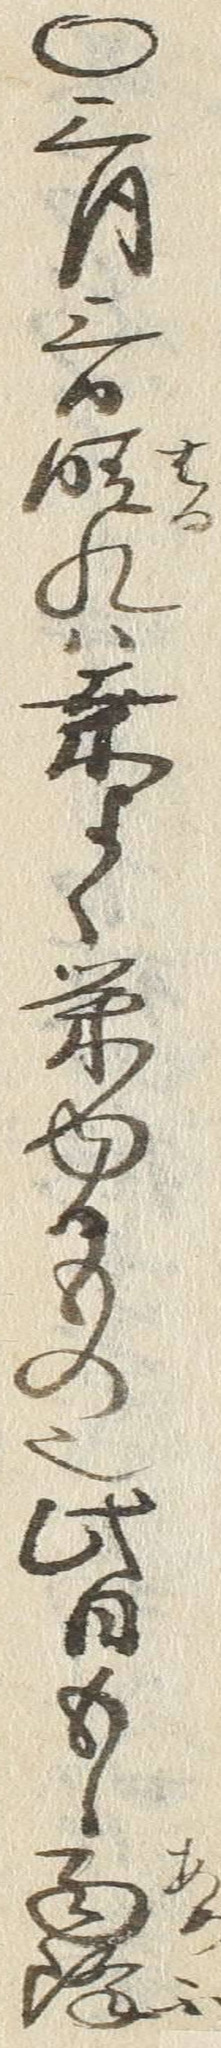〇三月三日晴れは桑よく栄ゆるもの也此日もし雨降
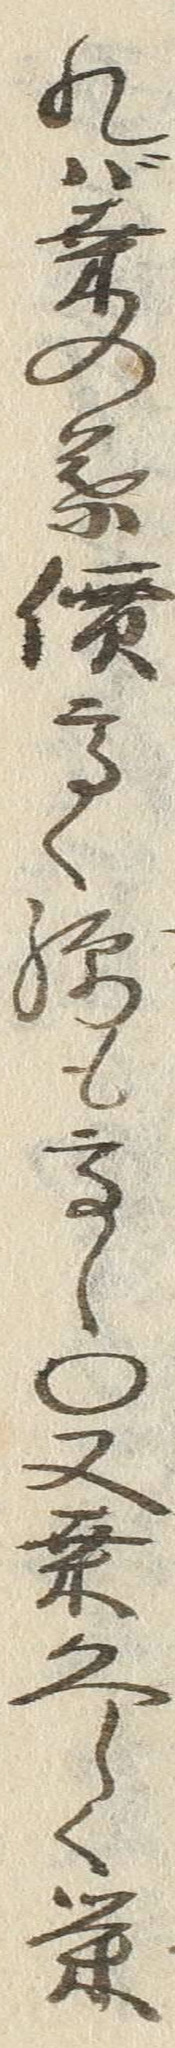れば桑の葉價高く綿も高し〇又桑久しく栄
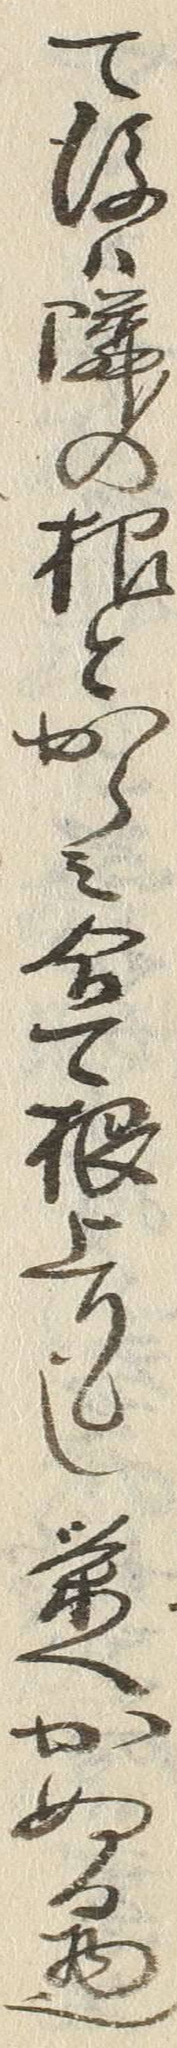て後は隣の根とからみ合て根上りもし栄へかぬる物也
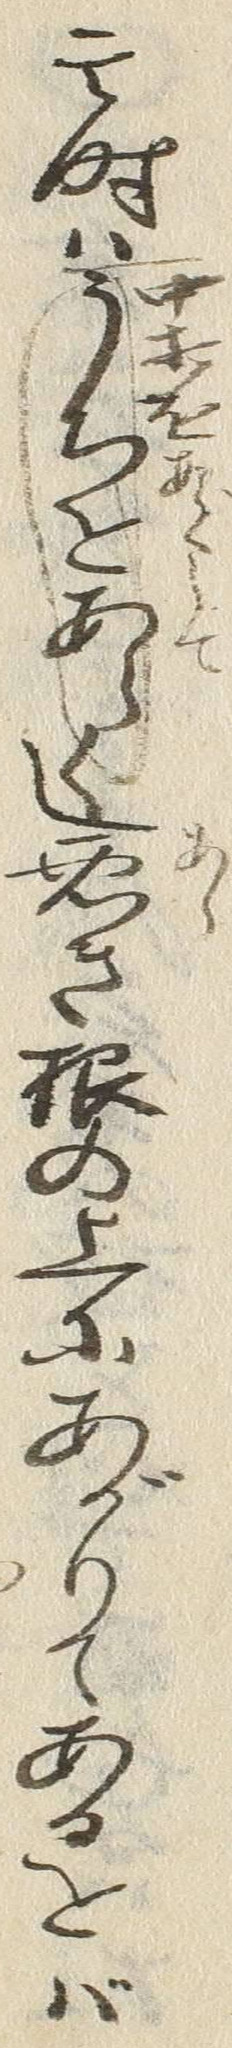其時は中打をあらくして悪き根の上尓あがりてあるをば
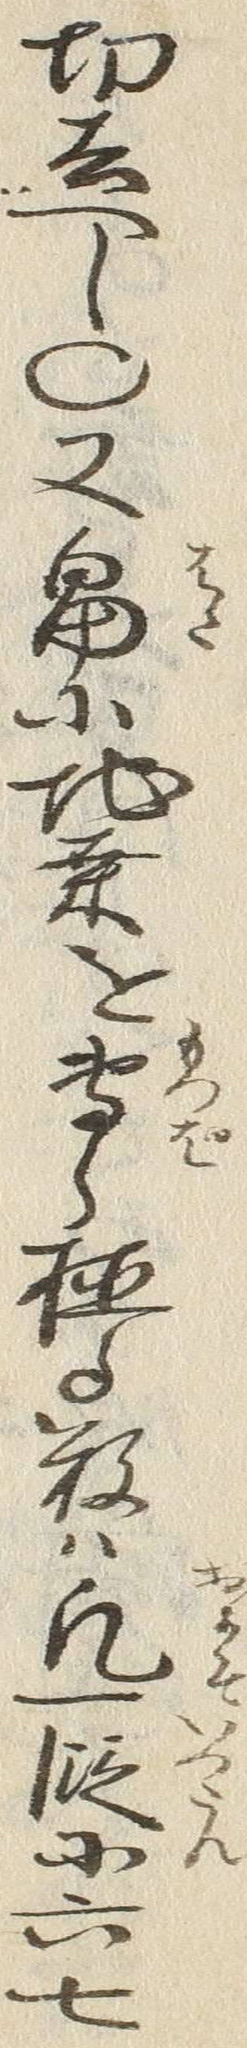切去へし〇又畠尓地桑を専ら植る数は凡一段尓六七
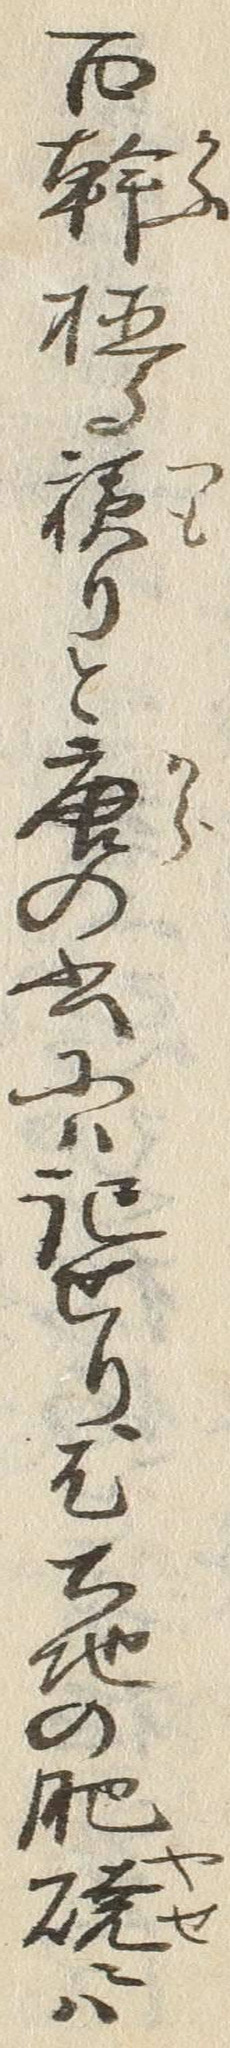百奸幹植る積りと唐の書尓は記せり尤土地の肥磽には
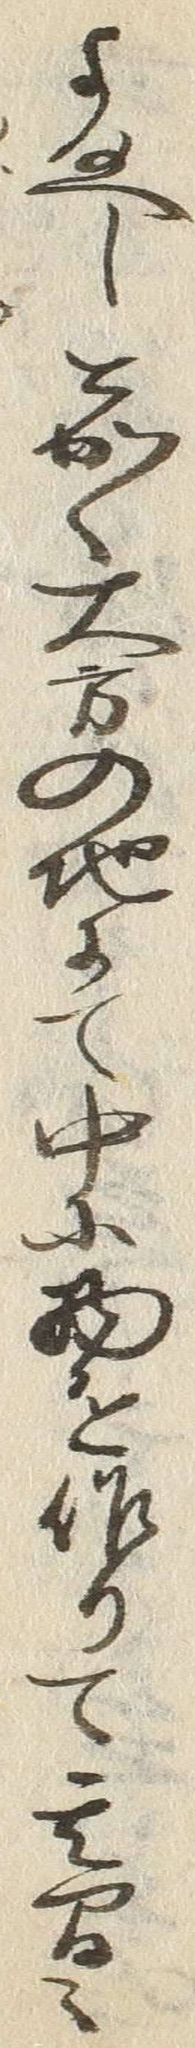よりへしとかく大方の地尓て中尓物を作りて其間に
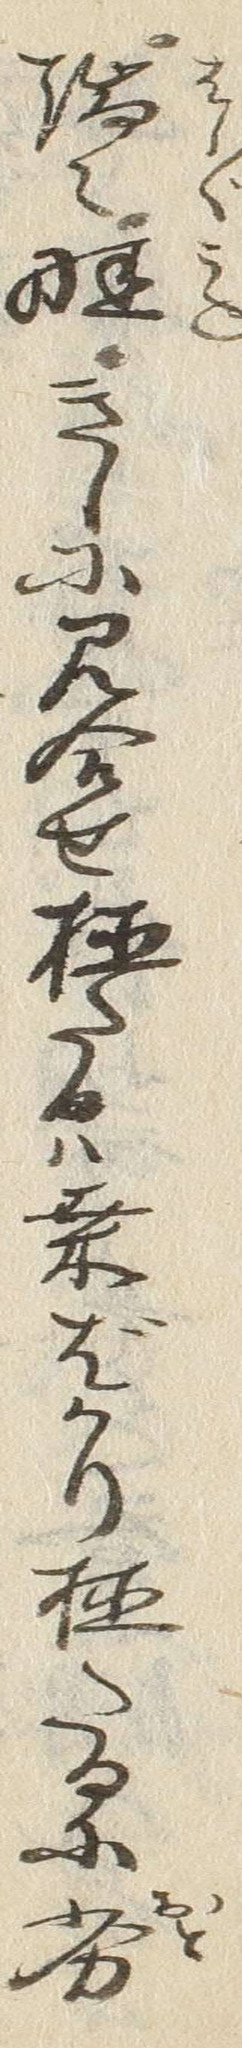端々畦きし尓見合せ植たるは桑ばかり植たる尓劣
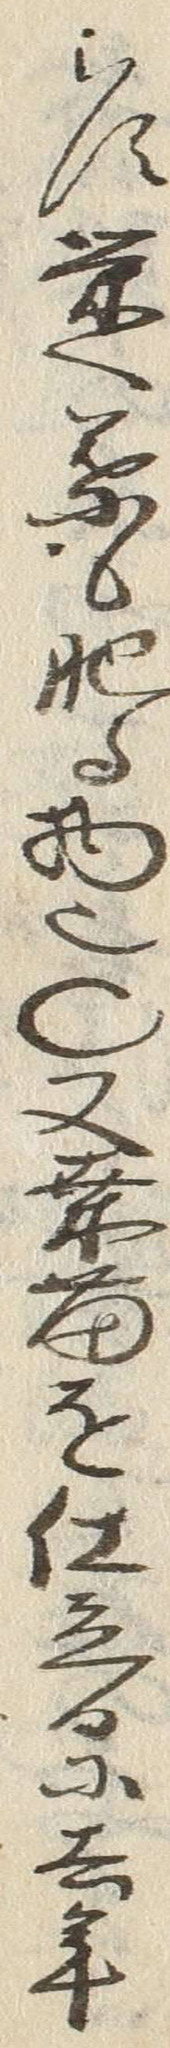ら須栄へ葉も肥る物也〇又桑苗を仕立る尓去年
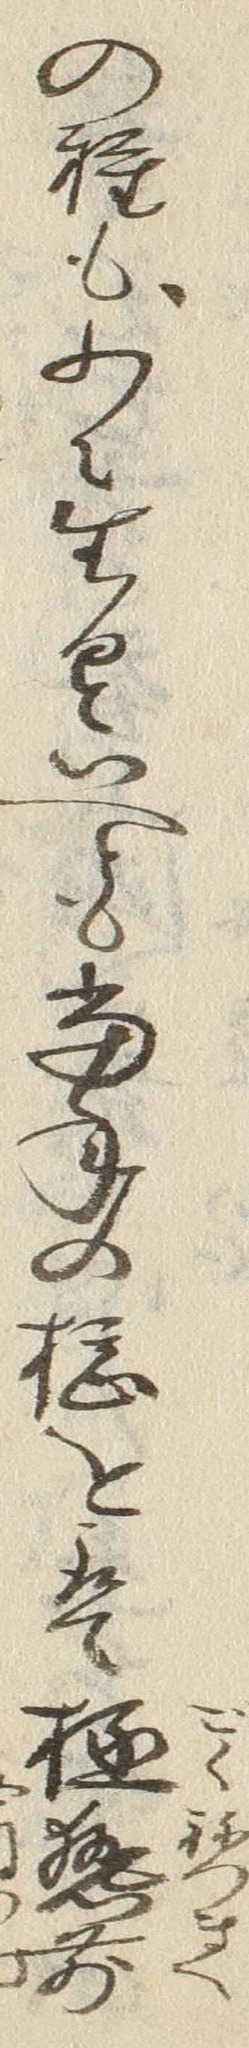の種も少々生るといへとも当年の椹を取て極熱前
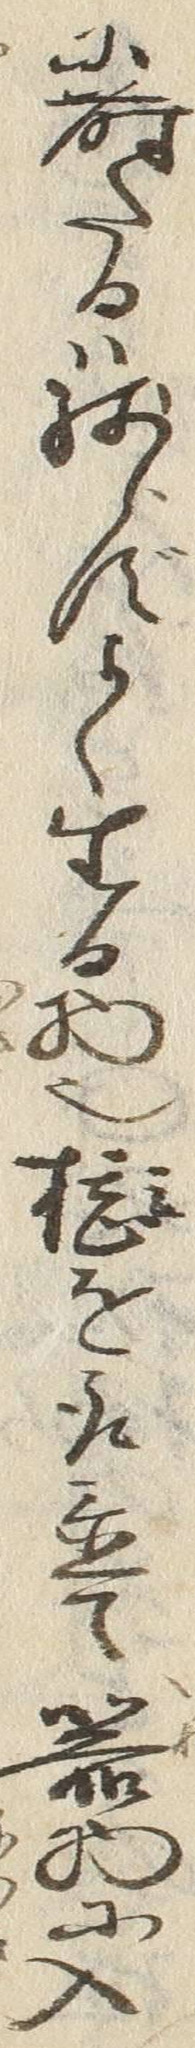尓蒔たるは残らずよく生る物也椹を取起き置て器物尓入
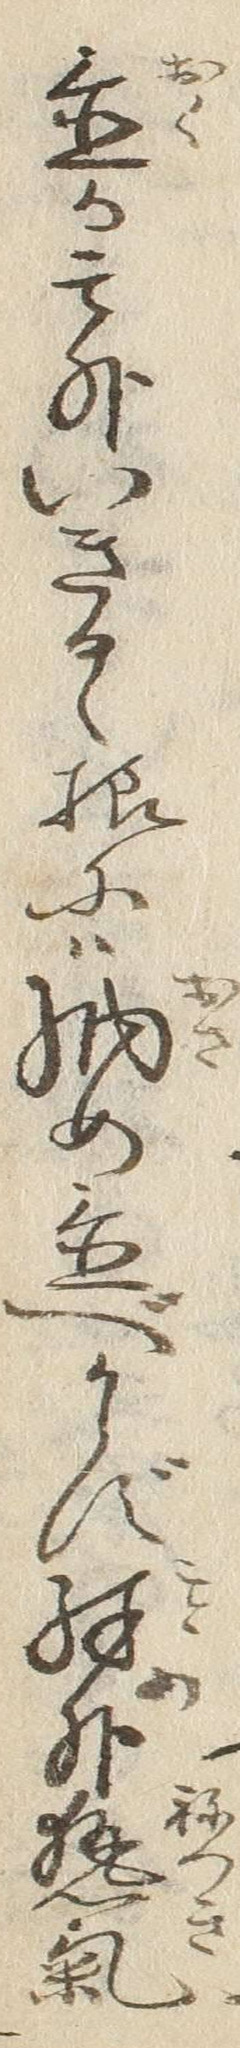置る其外いきるゝ様尓は納め置べからず殊外熱氣
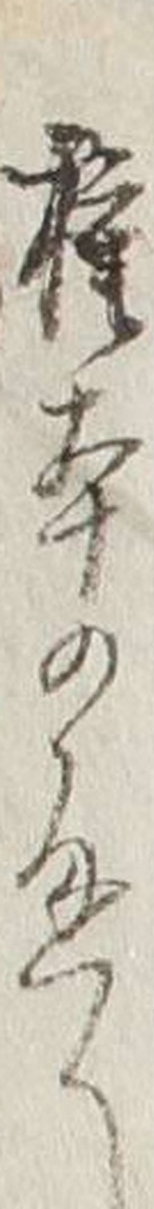種本の痛り
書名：養蠶實驗録後編
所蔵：東京大学農学生命科学図書館 国文学研究資料館
